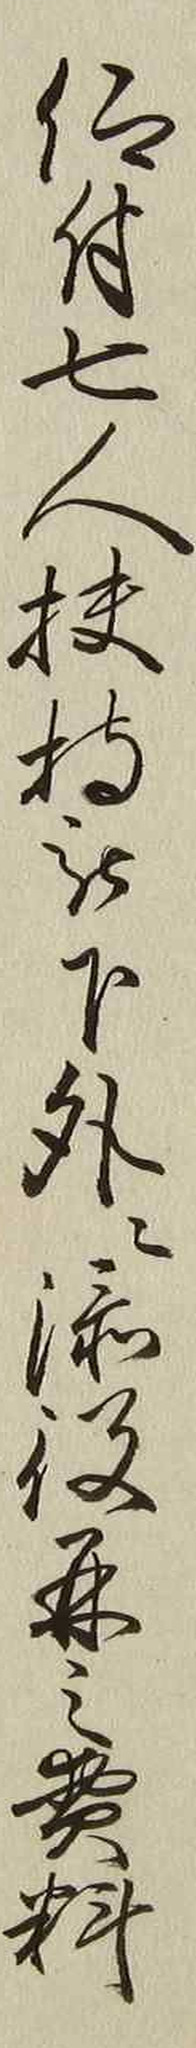仰付七人扶持被下外ニ添役并之費料
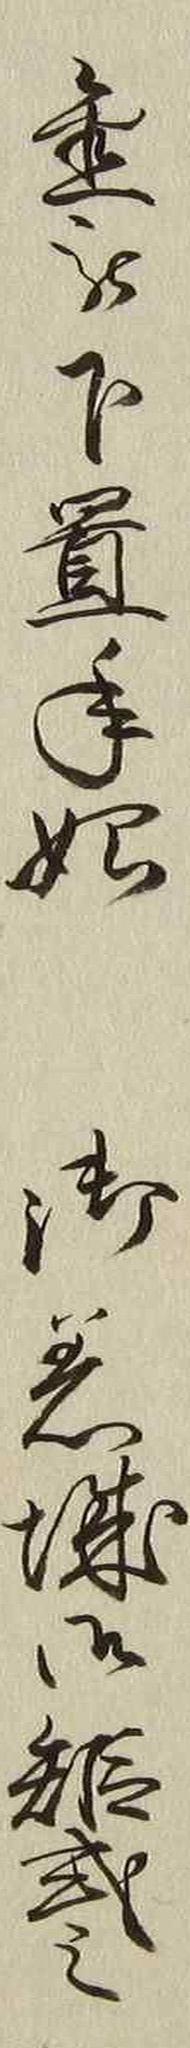金被下置年始御着城御矩式之
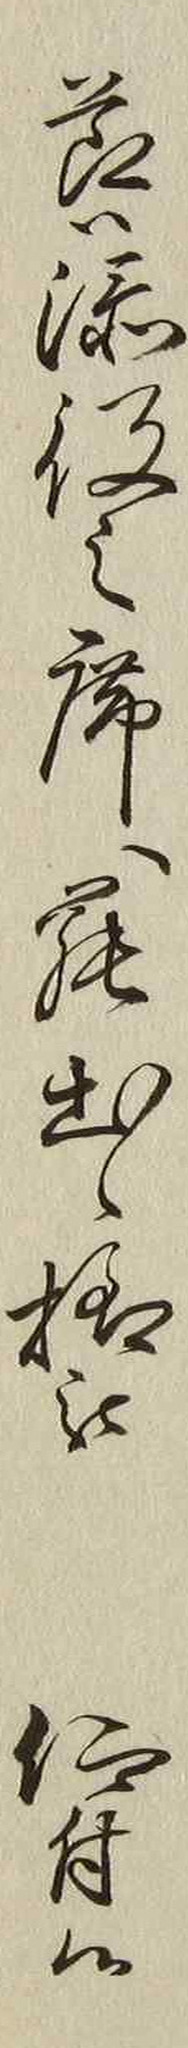節ハ添役之席へ罷出候様被仰付候
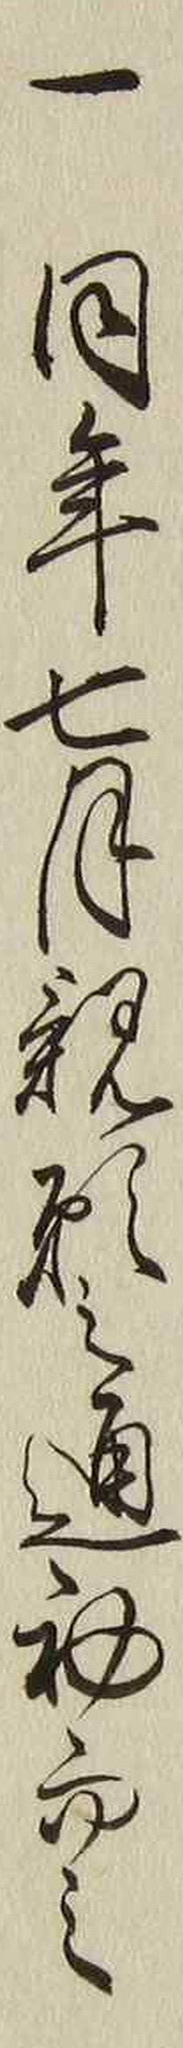一同年七月親願之通初而之
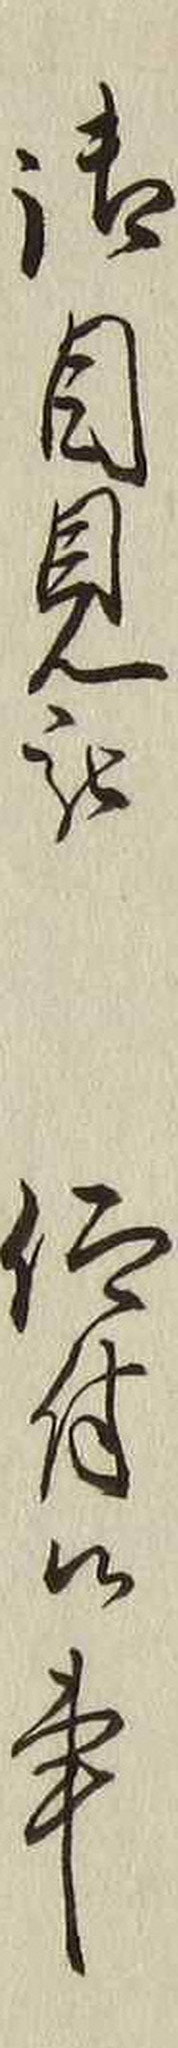御目見被仰付候事
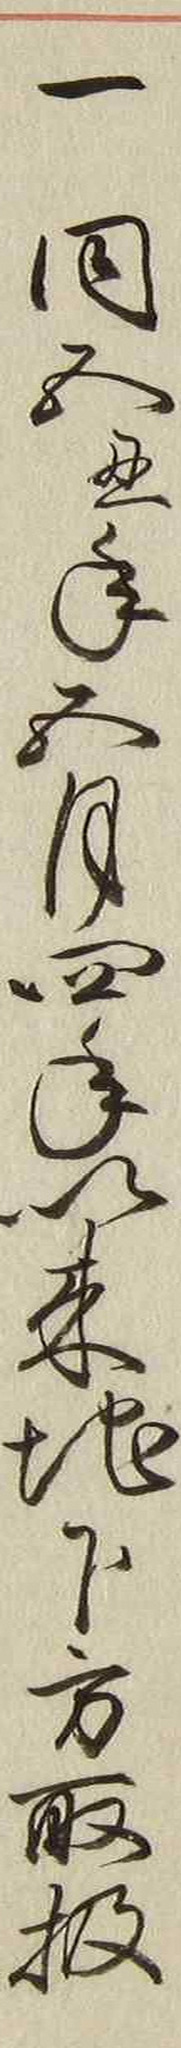一同五丑年五月四年以来地下方取扱
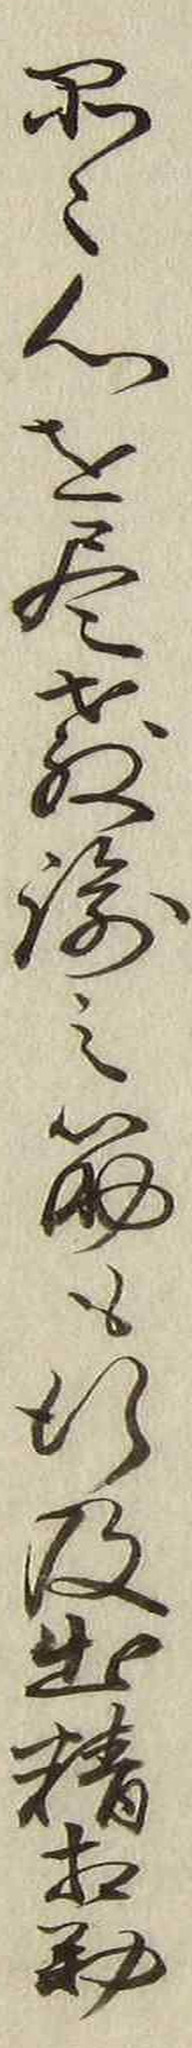品々心を尽教諭之筋も行及出精相勤
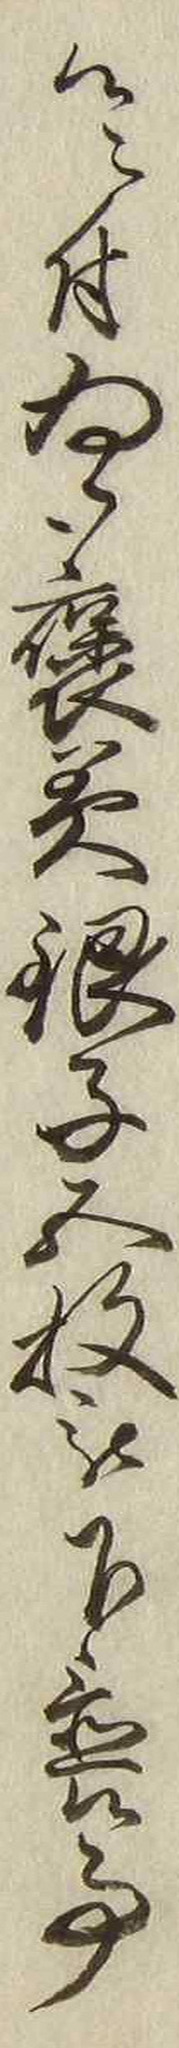候ニ付為御褒美銀子五枚被下置候事
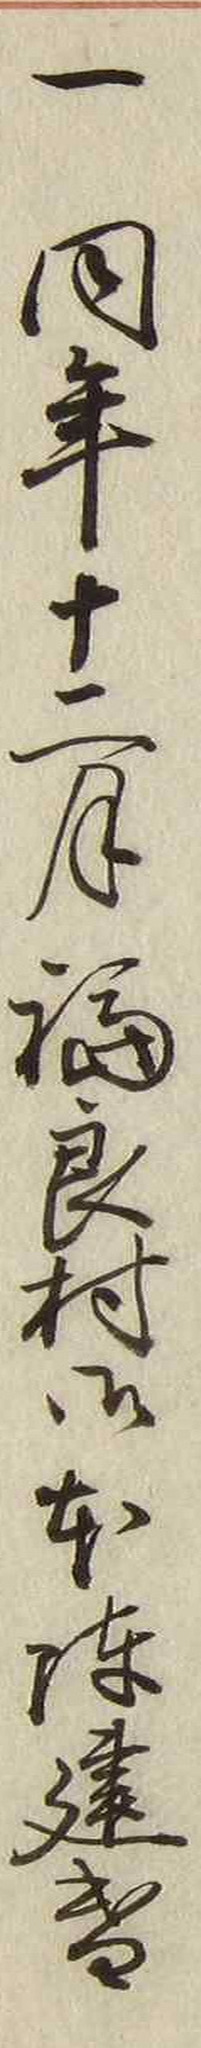一同年十二月福良村御本陣建替

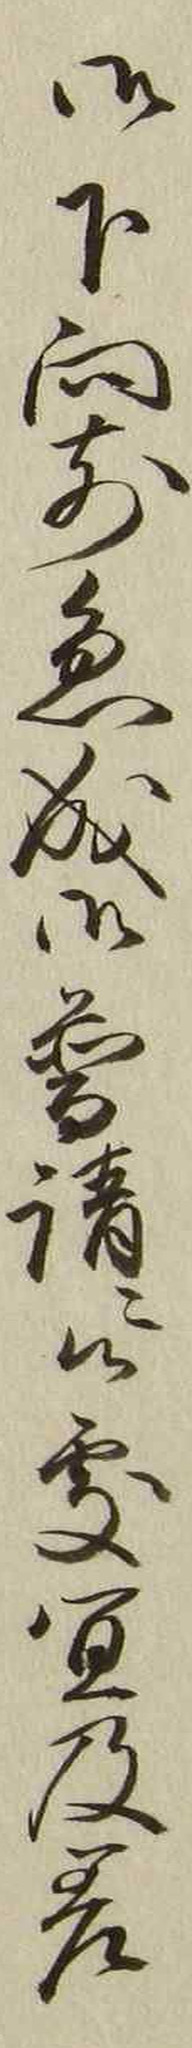御下向前急成御晋請ニ侯処宜及差
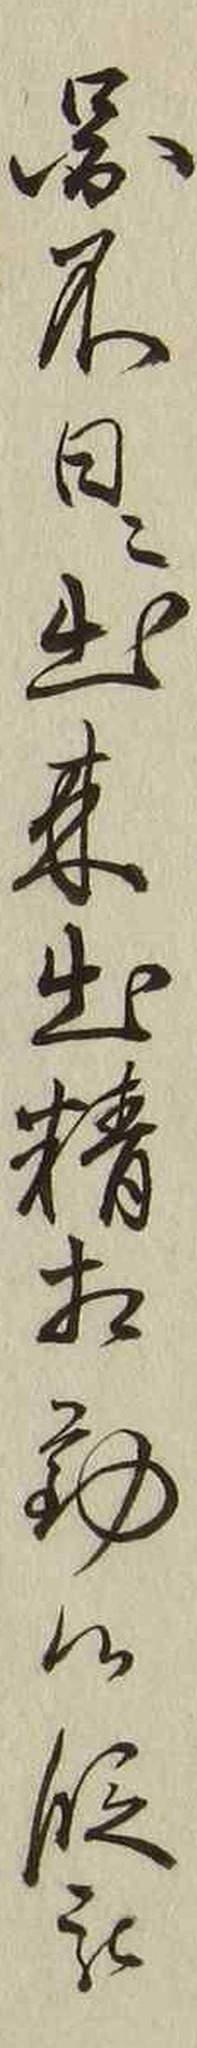図不日ニ出来出精相勤候段被
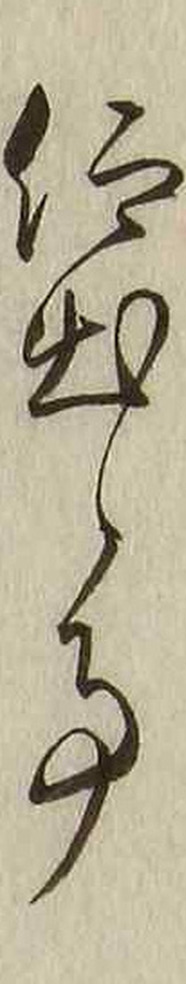仰出候事
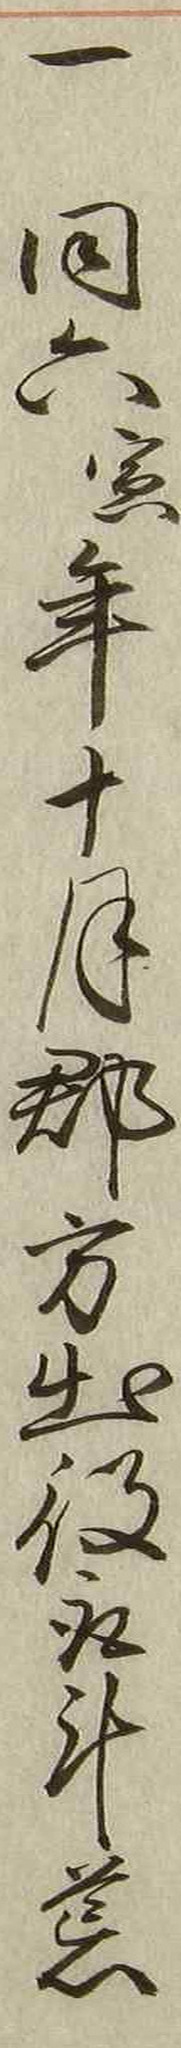一同六寅年十月郡方出役取斗荒
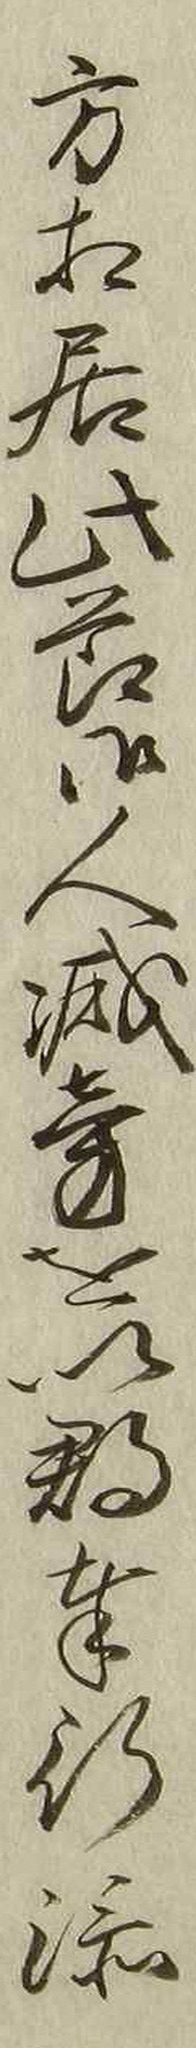方相居此節御人減旁を以郡奉行添
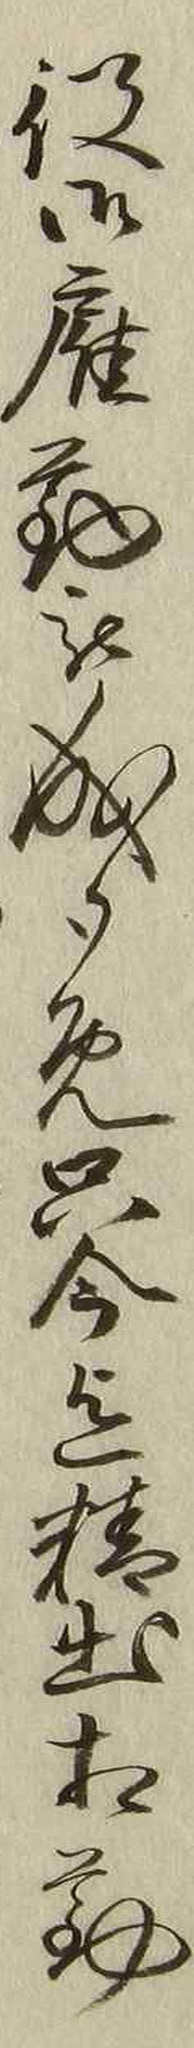役御雇勤被成御免只今迄精出相勤
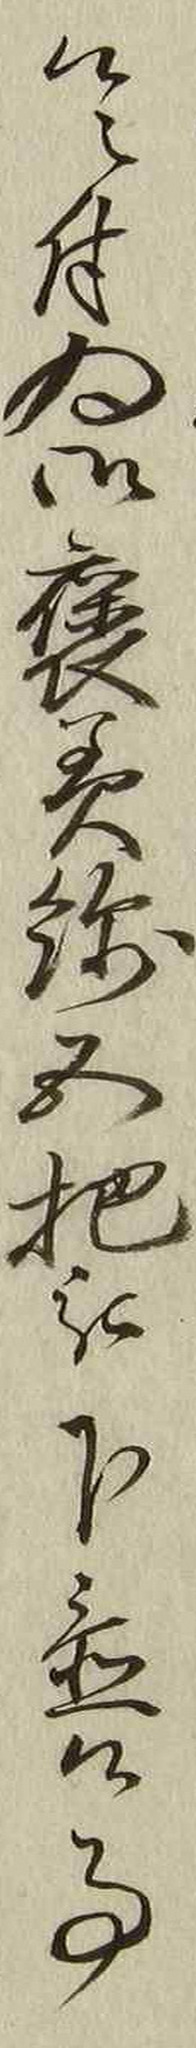候ニ付為御褒美綿五把被下置候事
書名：諸士系譜　巻之21　い之部21
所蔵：会津若松市立会津図書館
